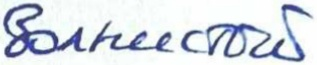волнистый
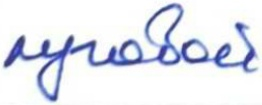луговой
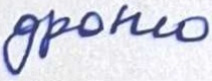дронго
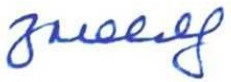змоеяд
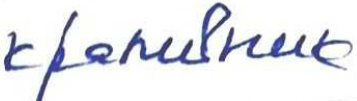крапивник
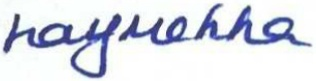науменна
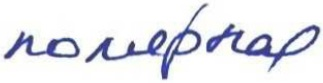полярная
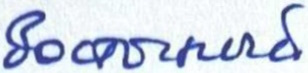восточный
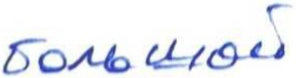большой
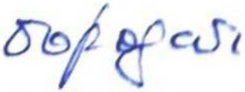бородач
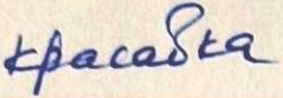красавка
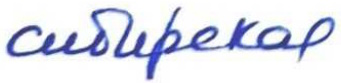сибирекая
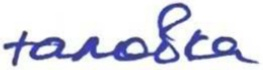таловка
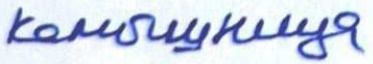комышница
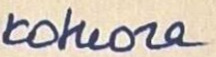конюга
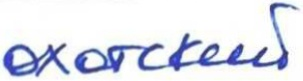охотский
